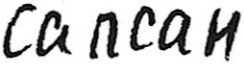сапсан
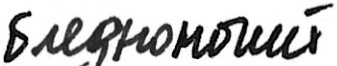бледноногий
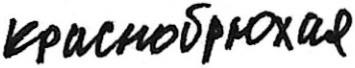краснобрюхая
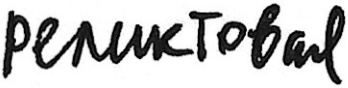реликтовая
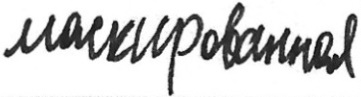маскированная
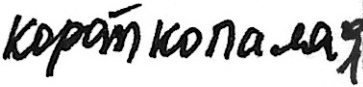короткопалая
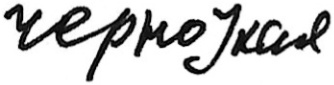черноухая
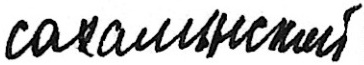сахалинский
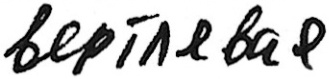вертлевая
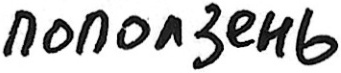поползень
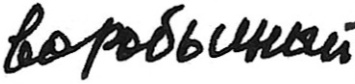воробьиный
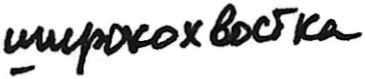широкохвостка
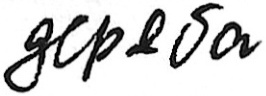деряба
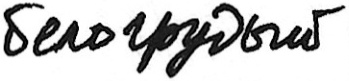белогрудый
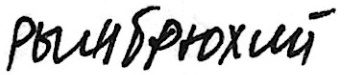рыжбрюхий
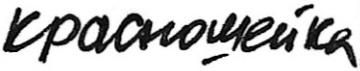красношейка
